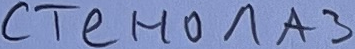стенолаз
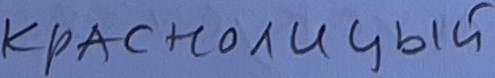краснолицый
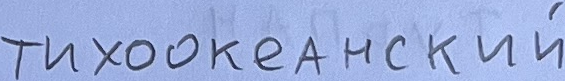тихоокеанский
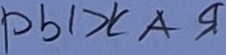рыжая
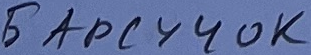барсучок
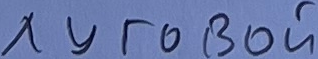луговой
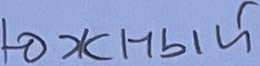южный
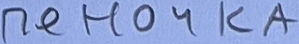пеночка
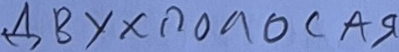двухполосая
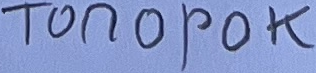топорок
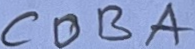сова
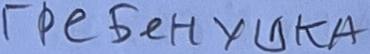гребенушка
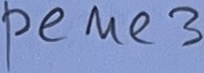ремез
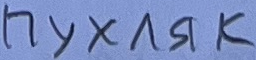пухляк
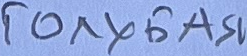голубая
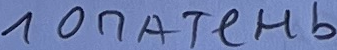лопатень
